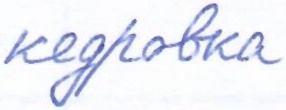кедровка
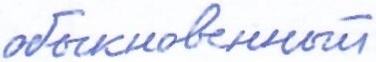обыкновенный
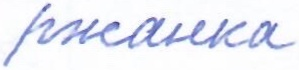ржанка
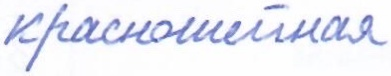красношейная
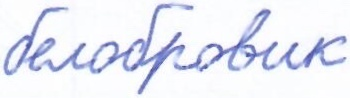белобровик
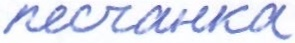песчанка
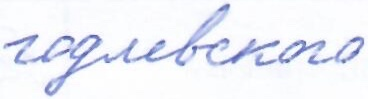годлевского
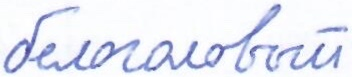белоголовый
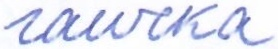гаичка
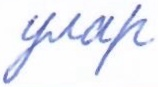улар
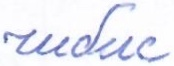чибис
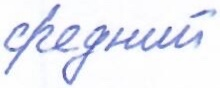средний
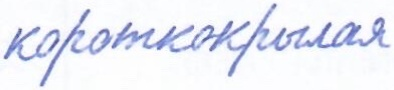короткокрылая
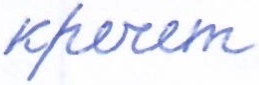кречет
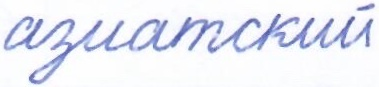азиатский
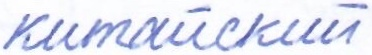китайский
